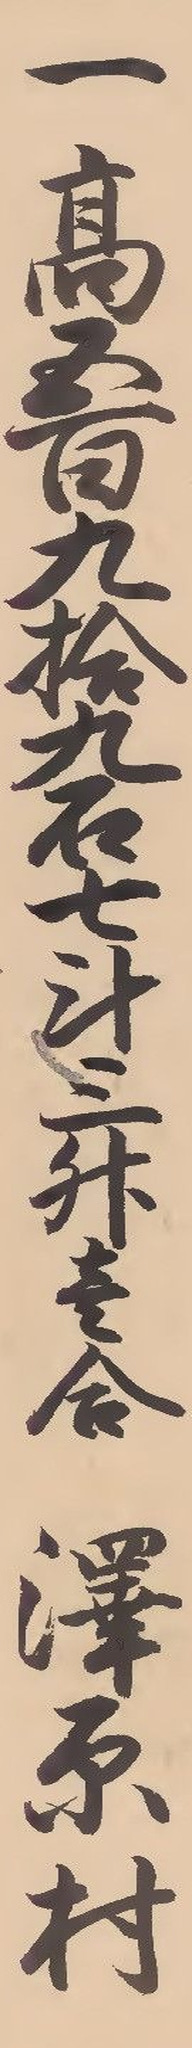一髙五百九拾九石七斗三升壱合澤原村

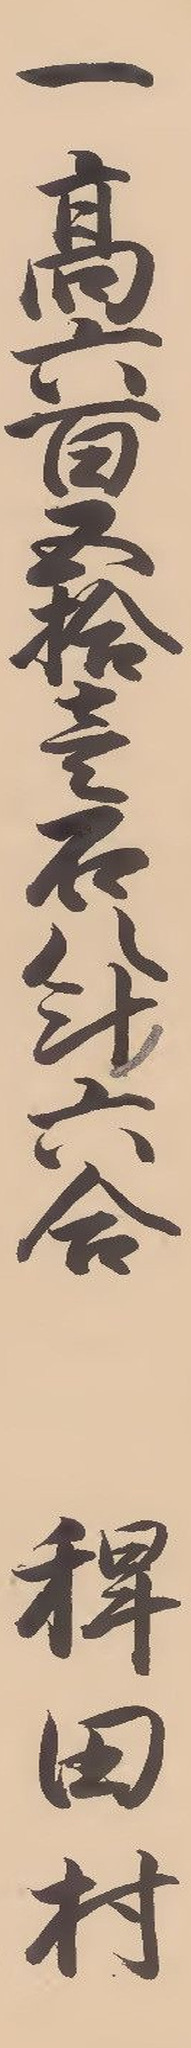一髙六百五拾壱石八升六合稗田村
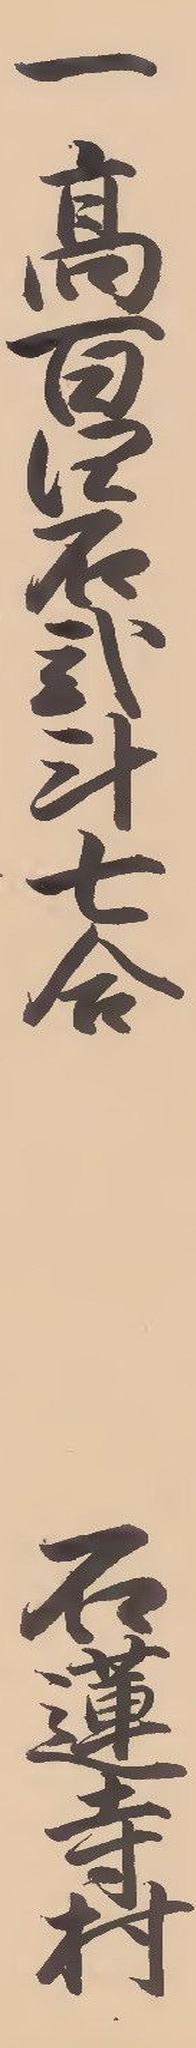一髙百四石弐斗七合石蓮寺村
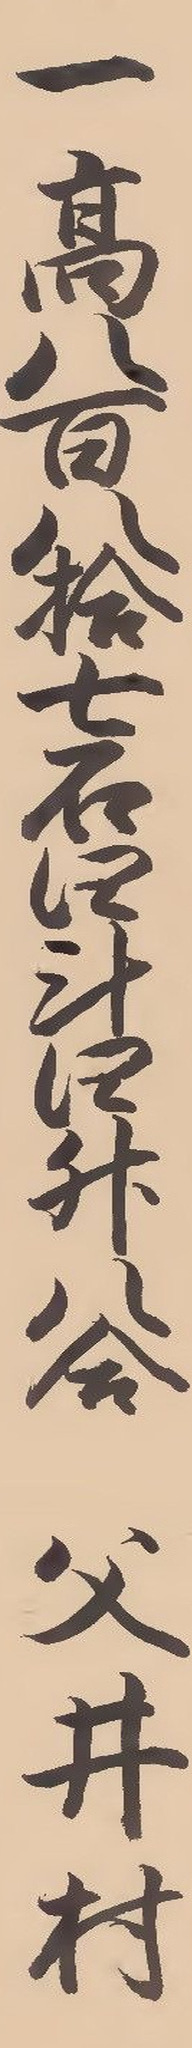一髙八百八拾七石四斗四升八合父井村
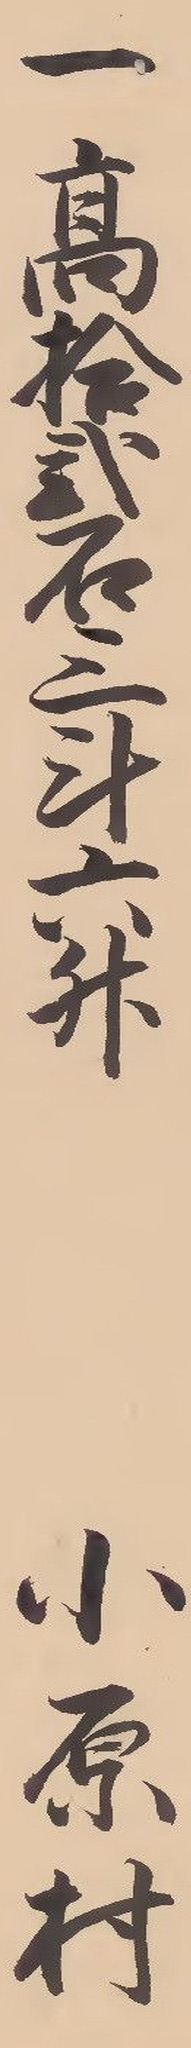一髙拾弐石三斗六升小原村
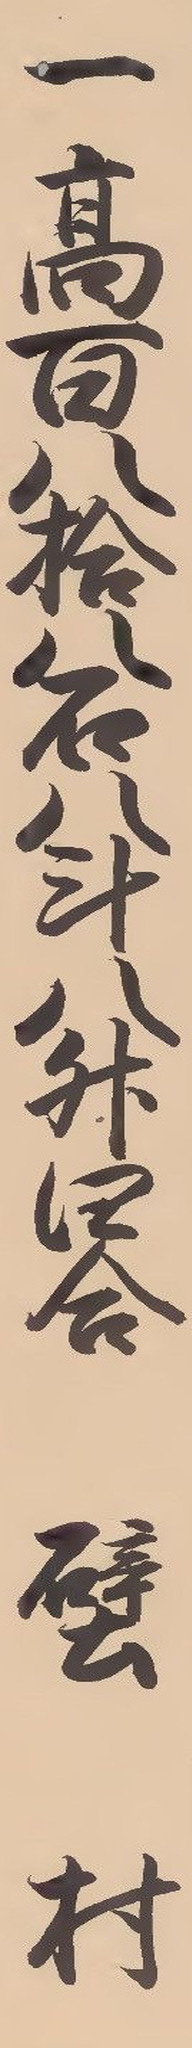一髙百八拾八石八斗八升四合壁村
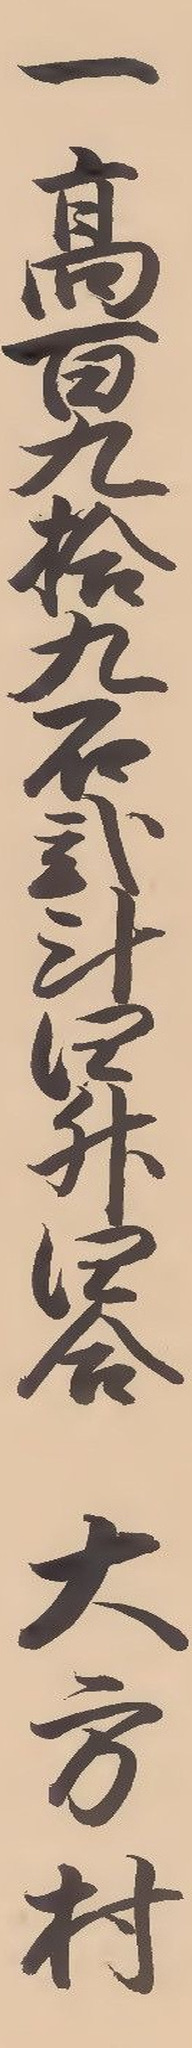一髙百九拾九石弐斗四升四合大方村
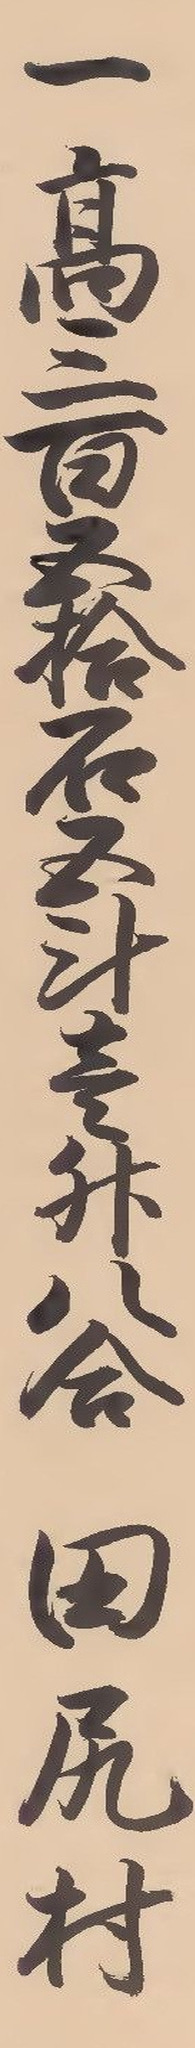一髙三百五拾石五斗壱升八合田尻村
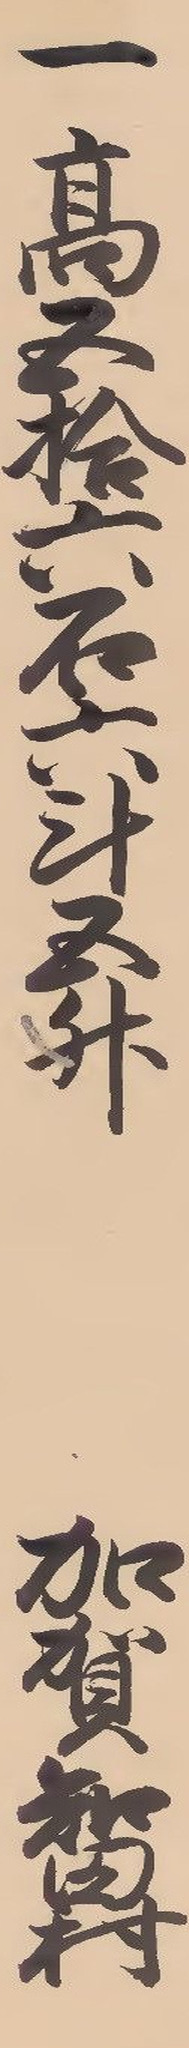一髙五拾六石六斗五升加賀知田村

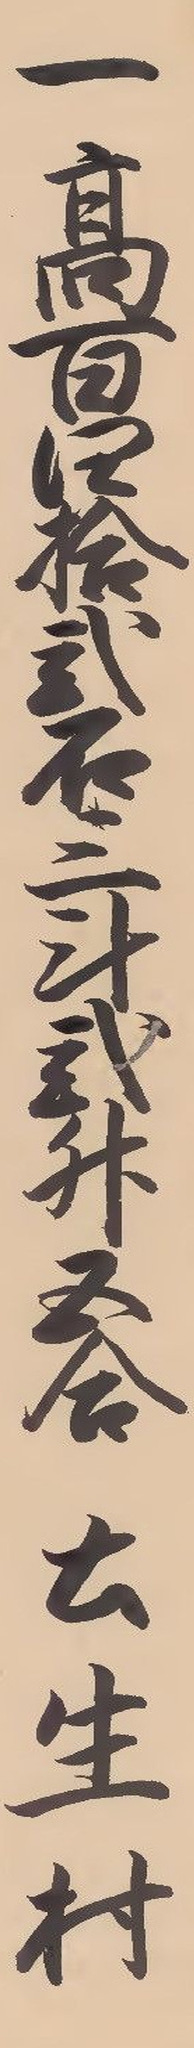一髙百四拾弐石三斗弐升五合土生村
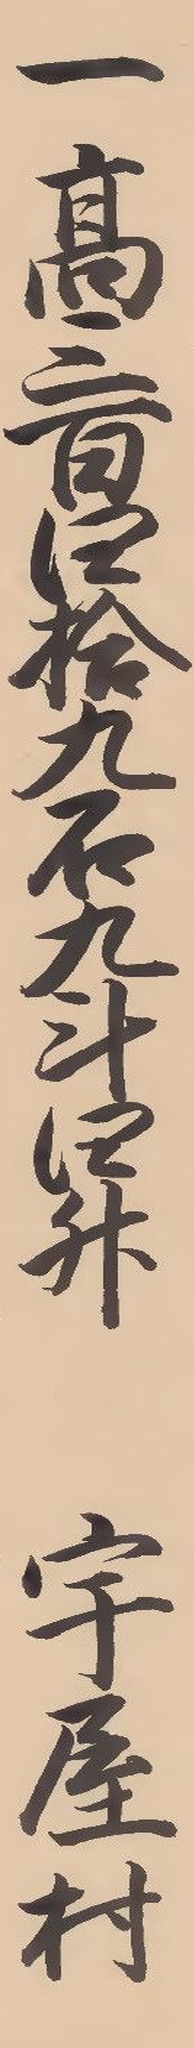一髙三百四拾九石九斗四升宇屋村
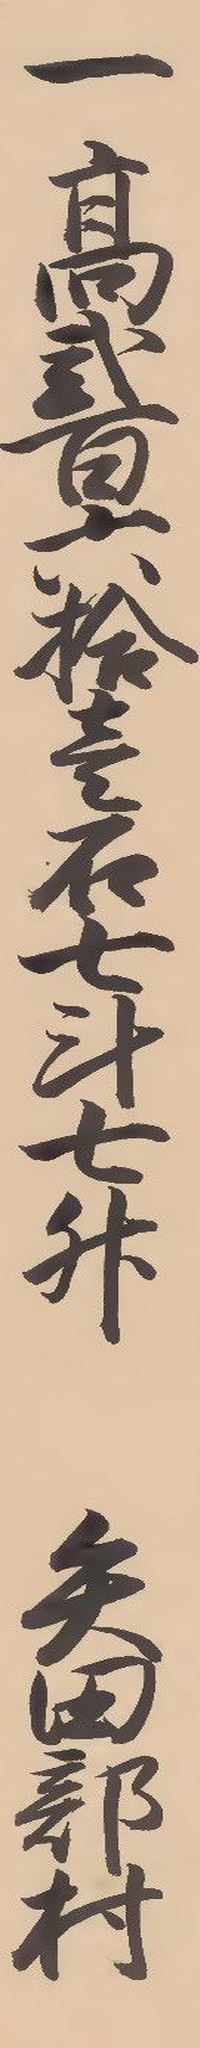一髙弐百六拾壱石七斗七升矢田部村
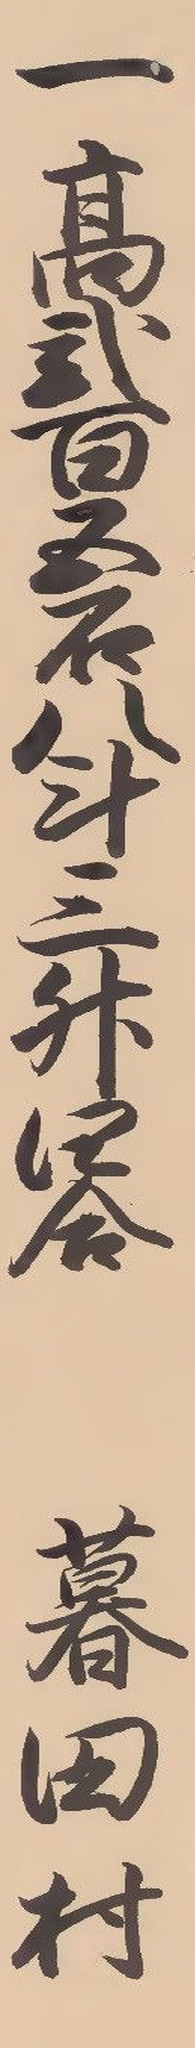一髙弐百五石八斗三升四合暮田村
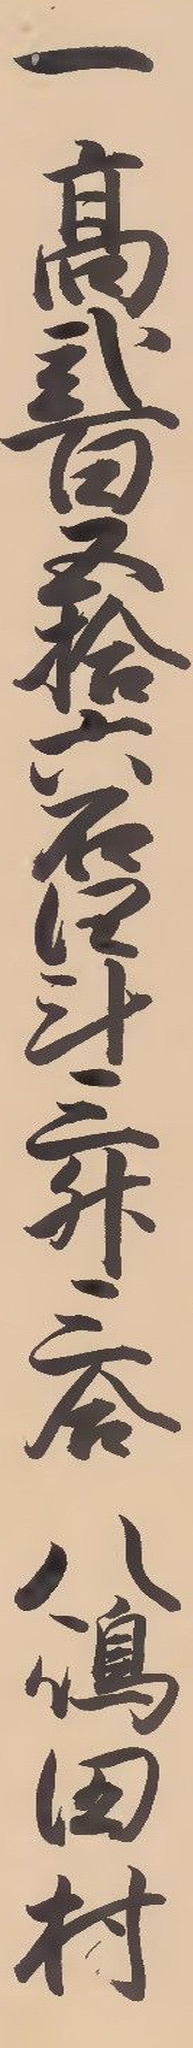一髙弐百五拾六石四斗三升三合八嶋田村
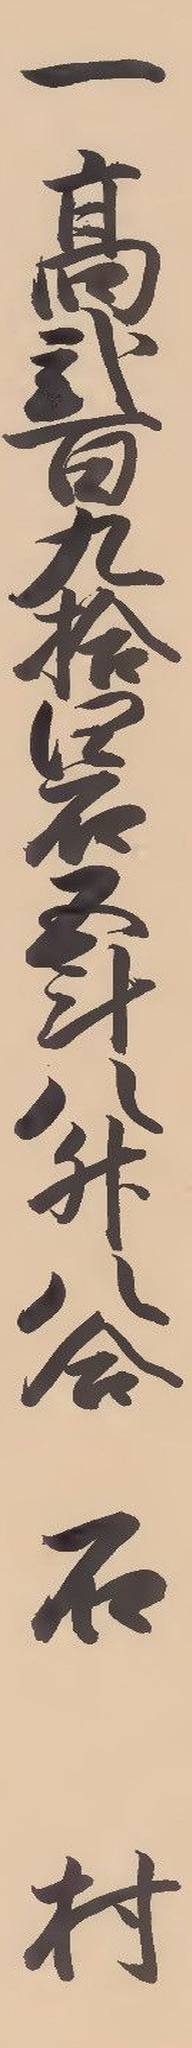一髙弐百九拾四石五斗八升八合石村
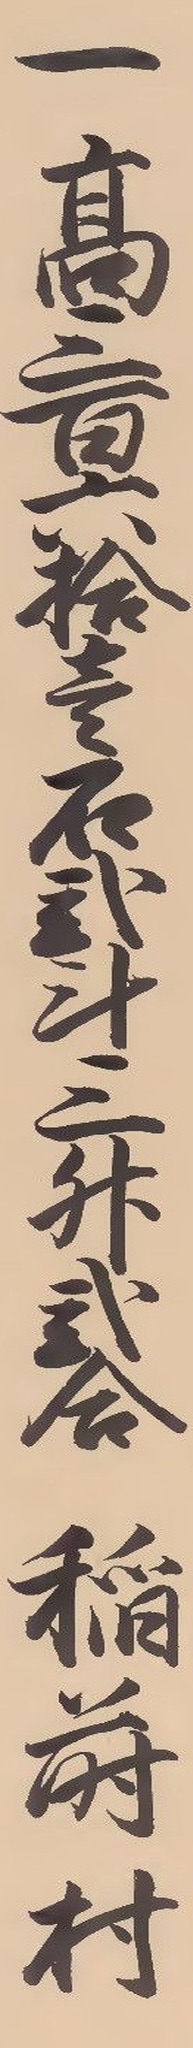一髙三百六拾壱石弐斗三升弐合稲蒔村
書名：備前国郷帳
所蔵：国立公文書館 National Archives of Japan
